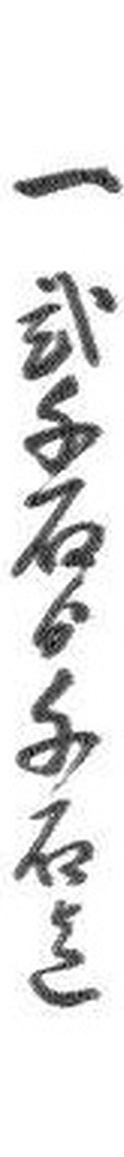一弐千石ゟ千石迄

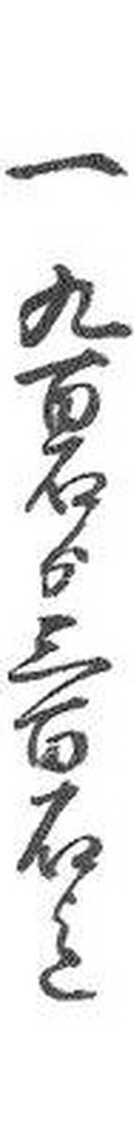一九百石ゟ三百石迄
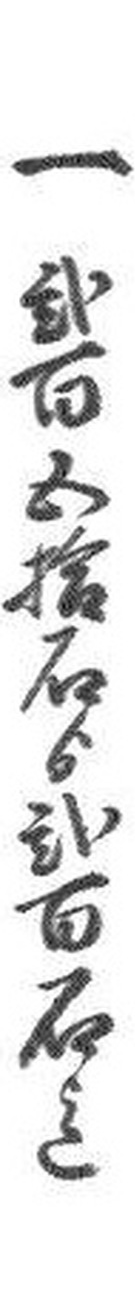一弐百五拾石ゟ弐百石迄
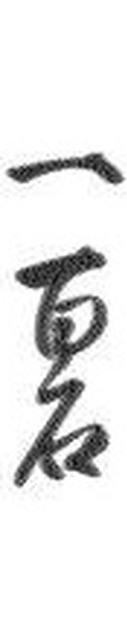一百石
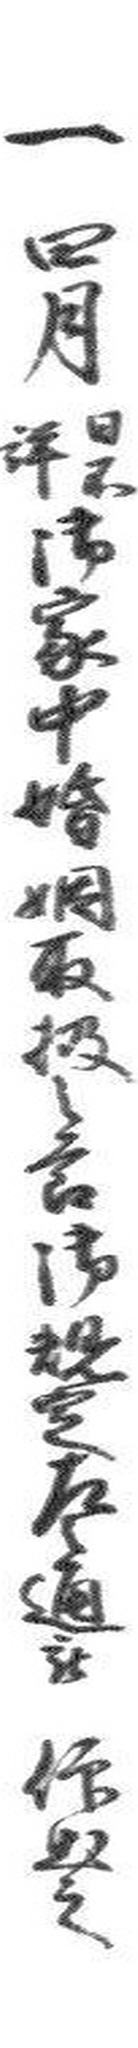一四月日不詳御家中婚姻取扱之節御規定左之通被仰出之

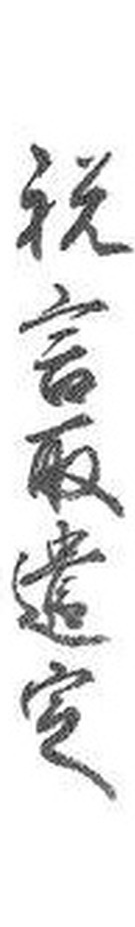祝言取遣定
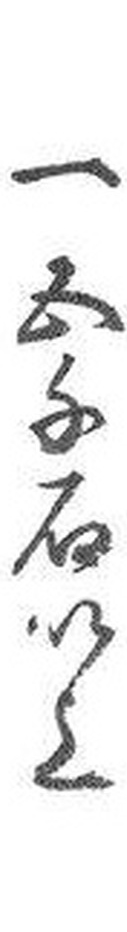一五千石以上
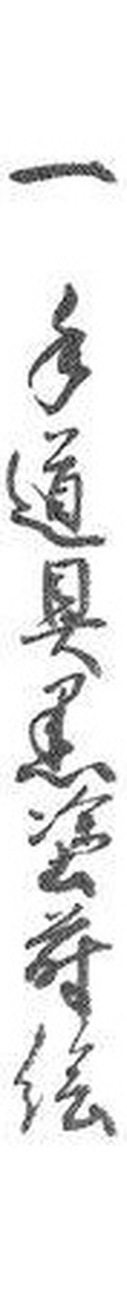一手道具黒塗蒔絵
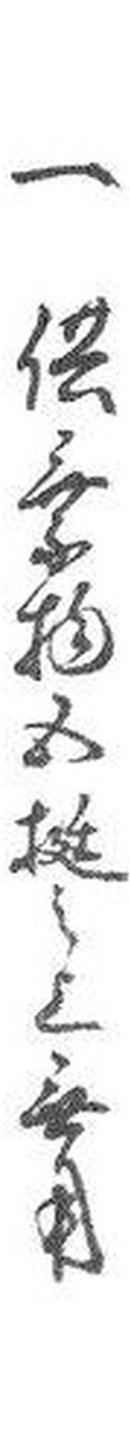一供乗物五挺之上無用
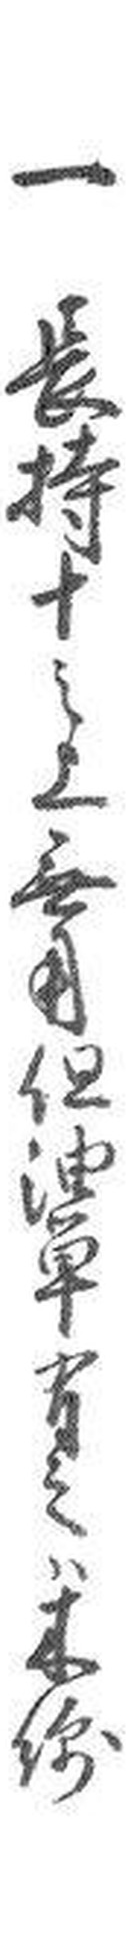一長持十之上無用但油単有之は木綿
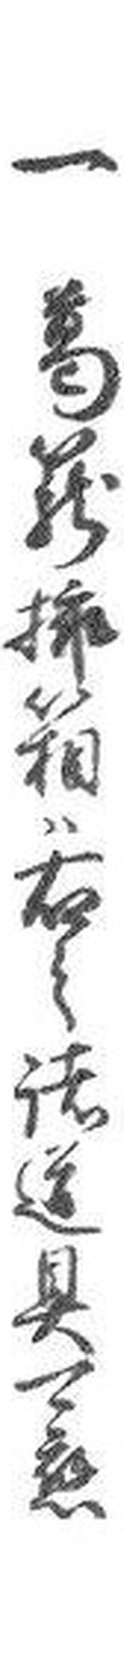一葛籠挿箱は右之諸道具可応
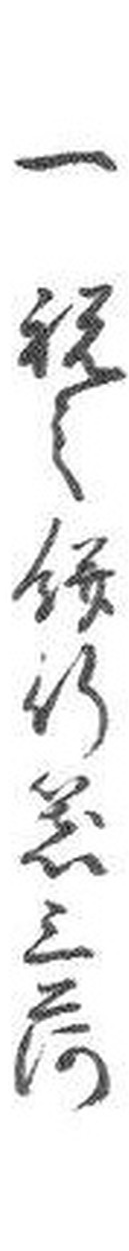一祝之餅行器三荷
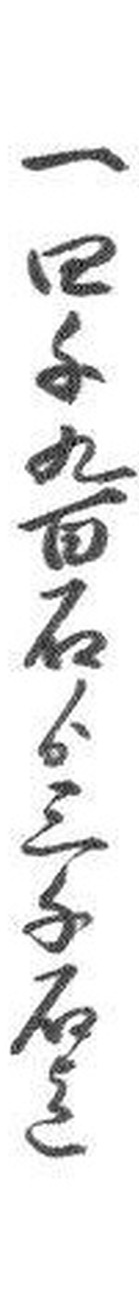一四千九百石ゟ三千石迄
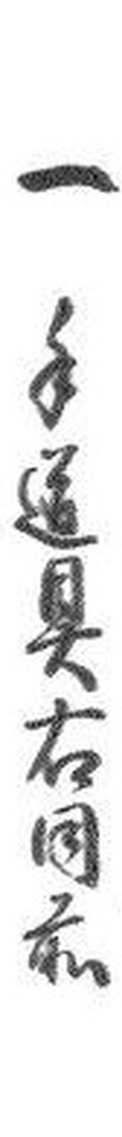一手道具右同前
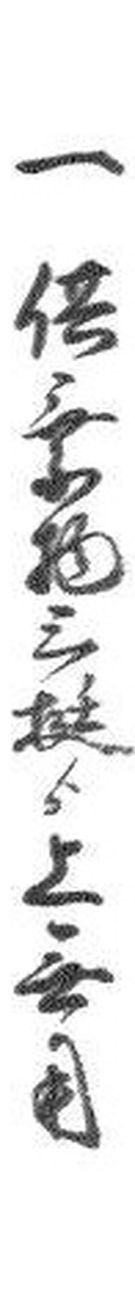一供乗物三挺ゟ上無用
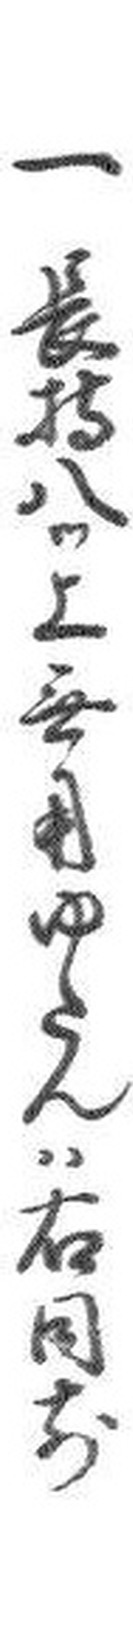一長持八ツ上無用ゆたんは右同前
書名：家譜 六 光通公 従万治三年到寛文三年
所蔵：福井県文書館 Fukui Prefectural Archives
